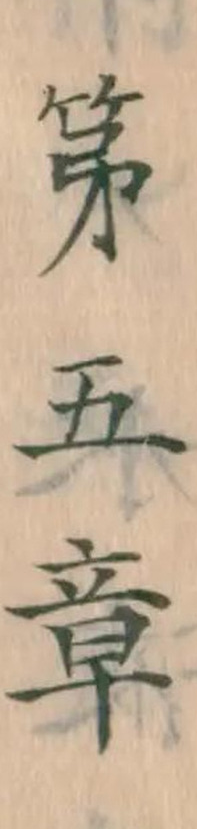第五章
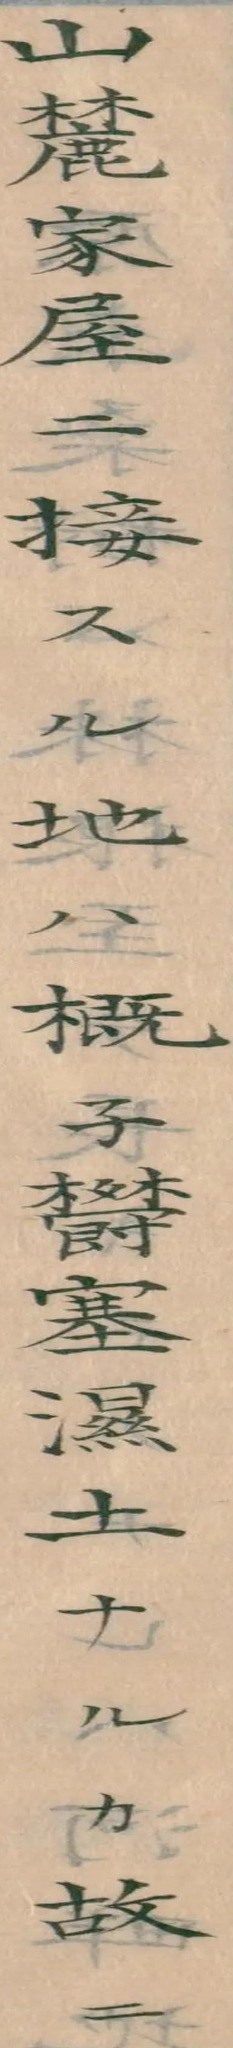山麓家屋ニ接スル地ハ概ネ鬱塞湿土ナルカ故ニ
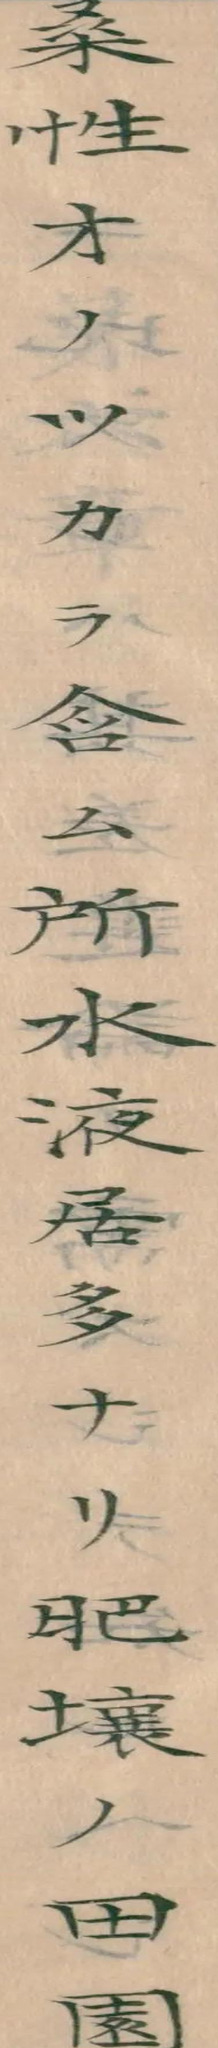桑性オノツカラ含ム所水液居多ナリ肥壌ノ田園
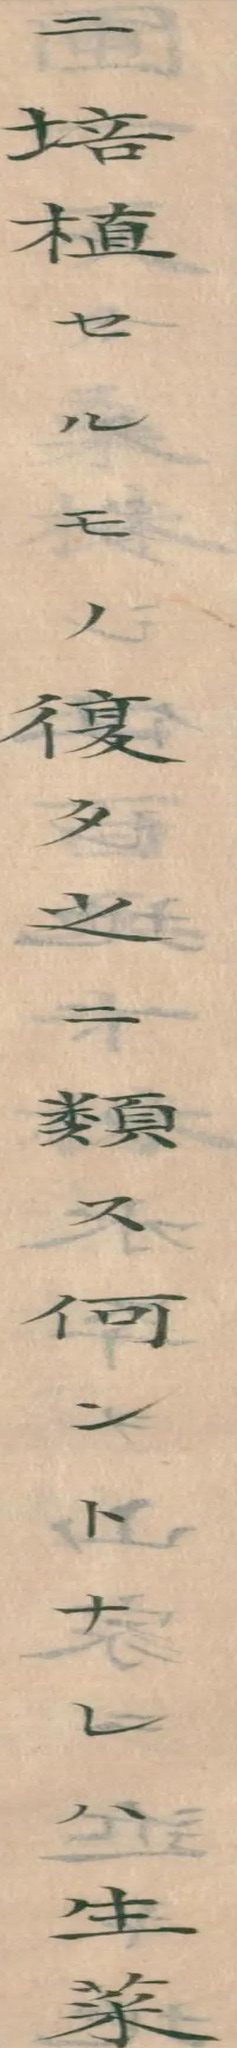ニ培植セルモノ復タ之ニ類ス何ントナレハ生菜
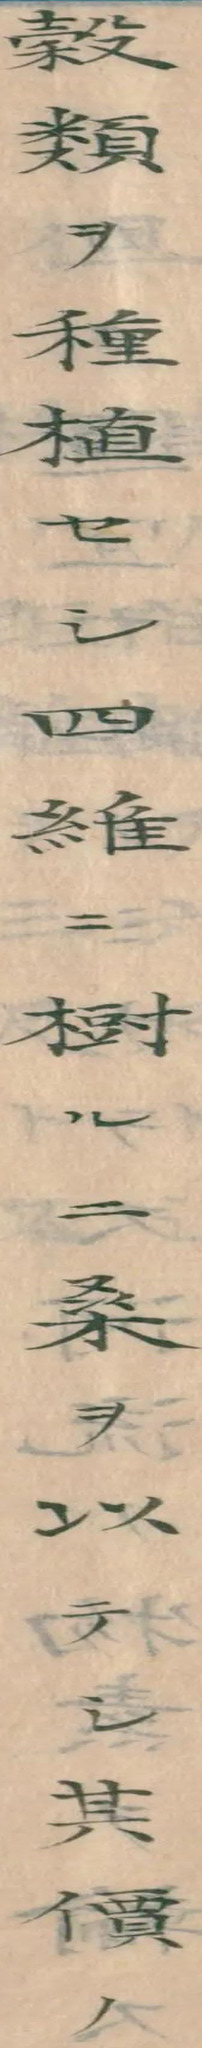穀類ヲ種植セシ四維ニ樹ルニ桑ヲ以テシ其価ノ
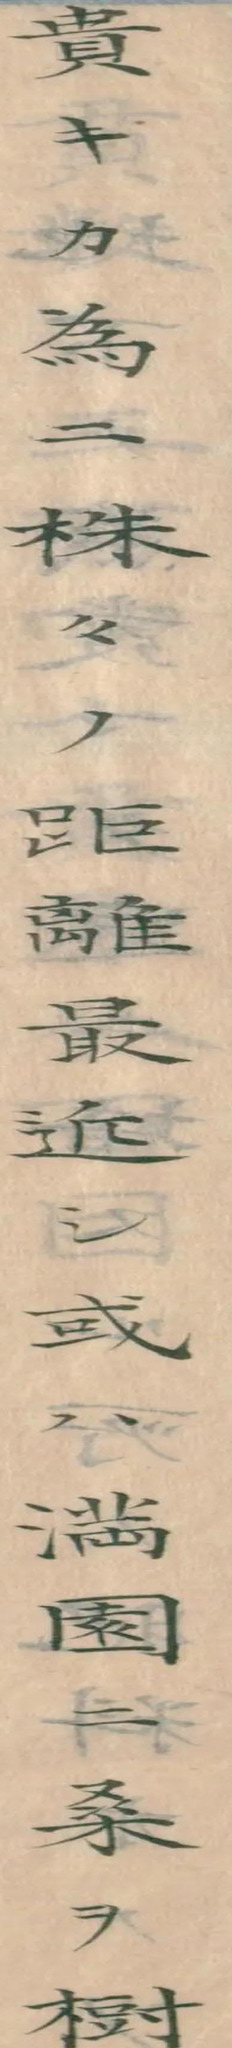貴キカ為ニ株々ノ距離最近シ或ハ満園ニ桑ヲ樹
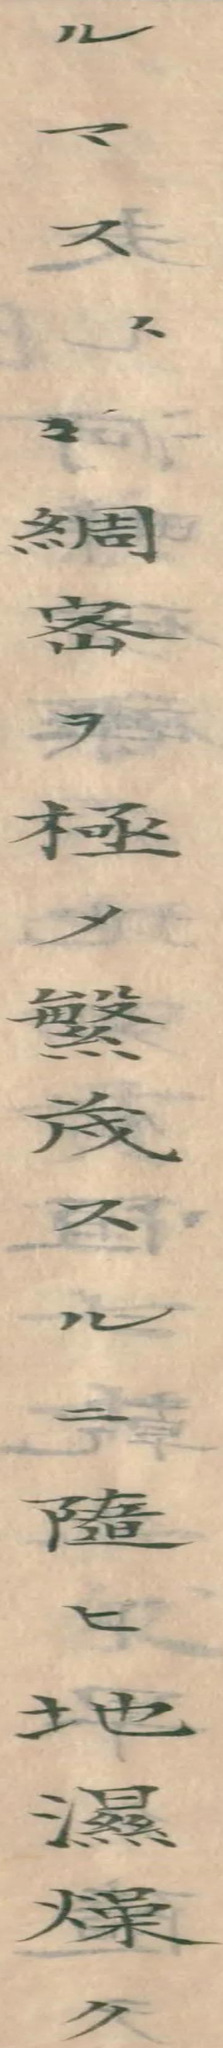ルマスヽヽ綢密ヲ極メ繁茂スルニ随ヒ地湿燥ク
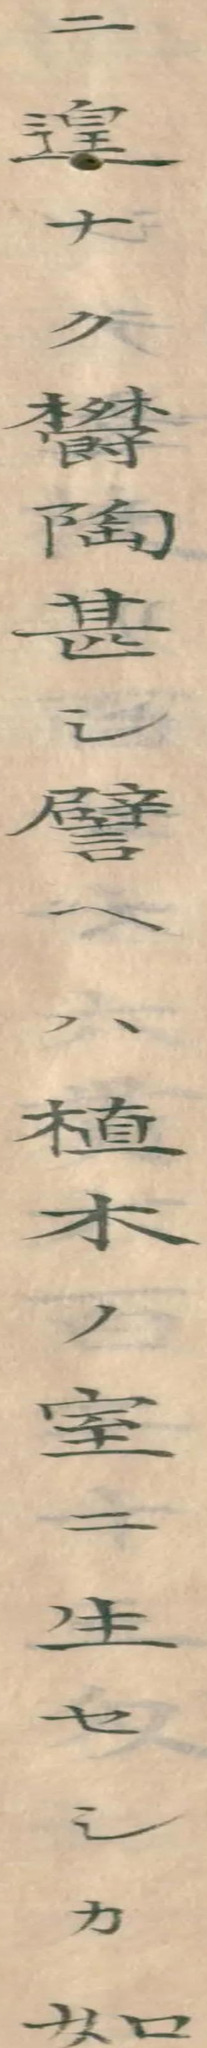ニ遑ナク欝陶甚シ譬ヘハ植木ノ室ニ生セシカ如
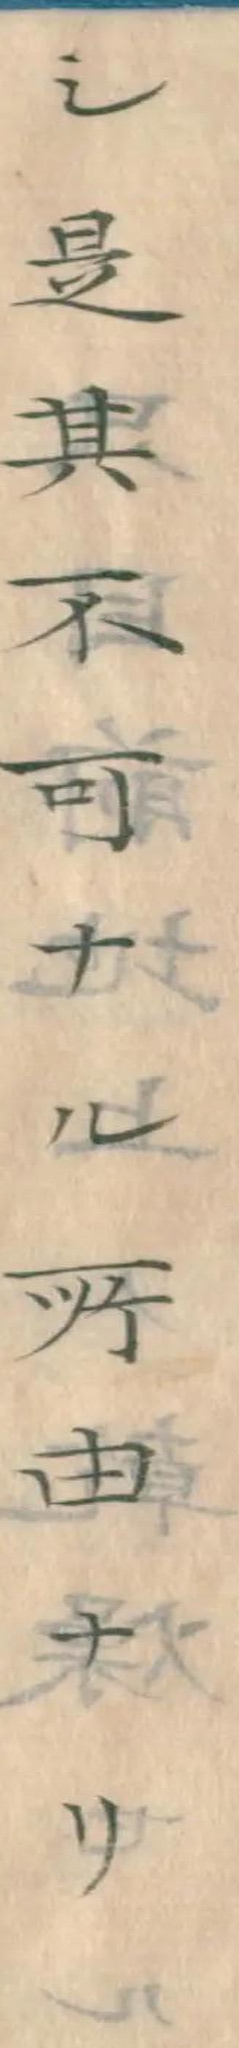シ是其不可ナル所由ナリ
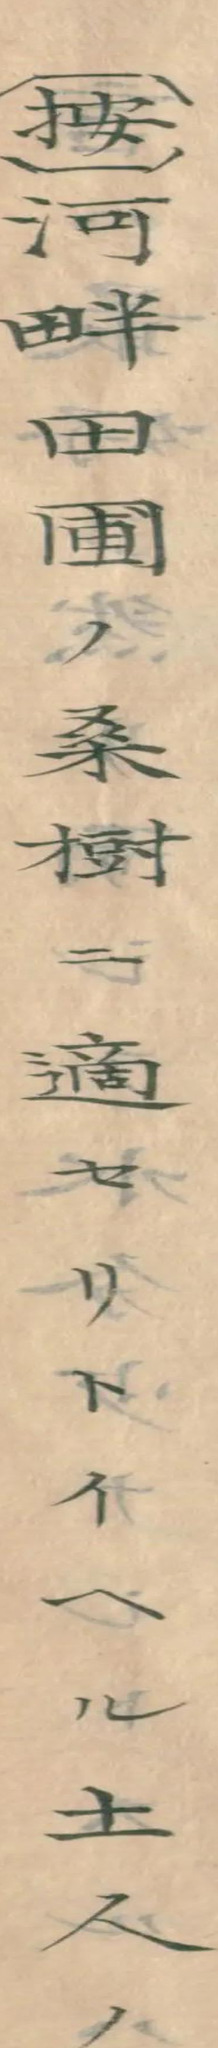[按]河畔田圃ノ桑樹ニ適セリトイヘル土人ノ

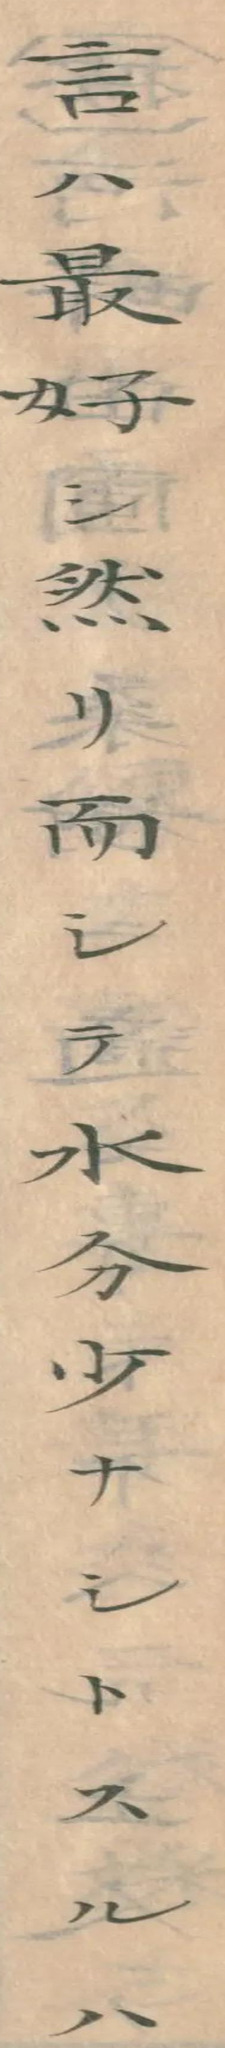言ハ最好シ然リ而シテ水分少ナシトスルハ
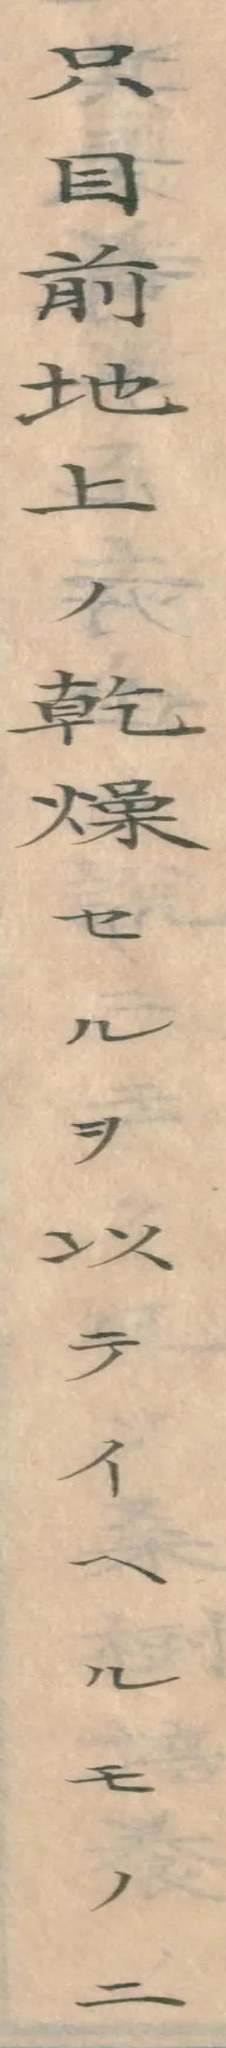只目前地上ノ乾燥セルヲ以テイヘルモノニ
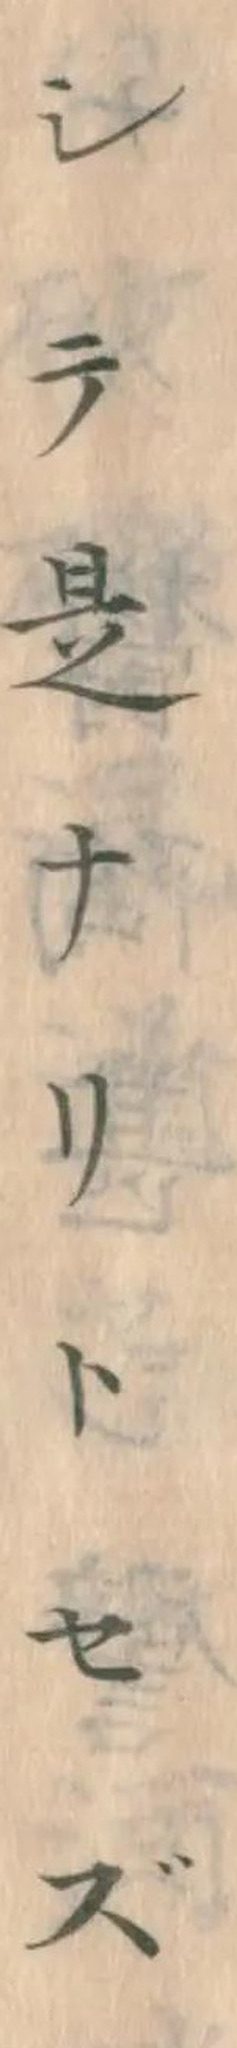シテ是ナリトセズ
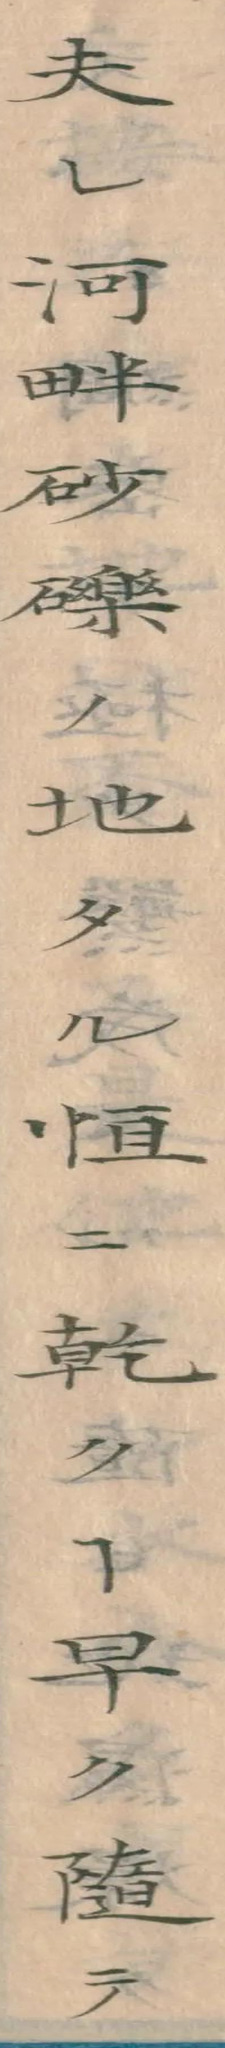夫レ河畔砂礫ノ地タル恒ニ乾クコト早ク随テ
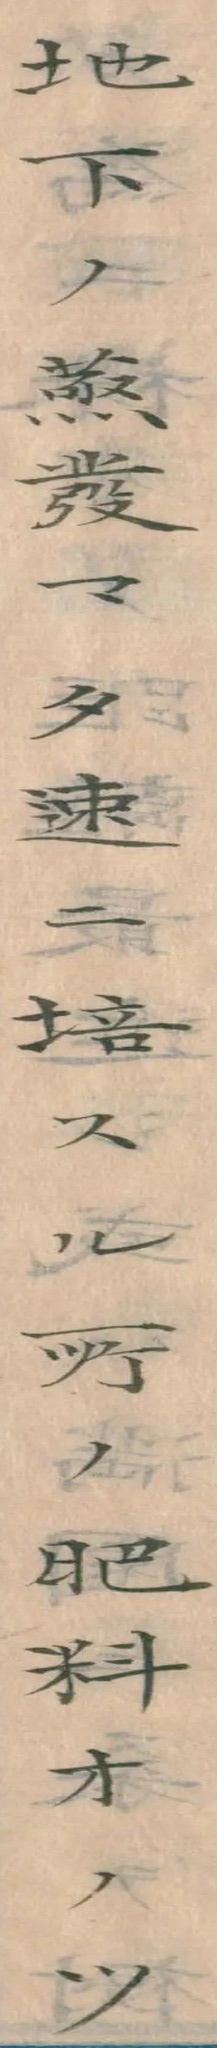地下ノ蒸発マタ速ニ培スル所ノ肥科オノツ
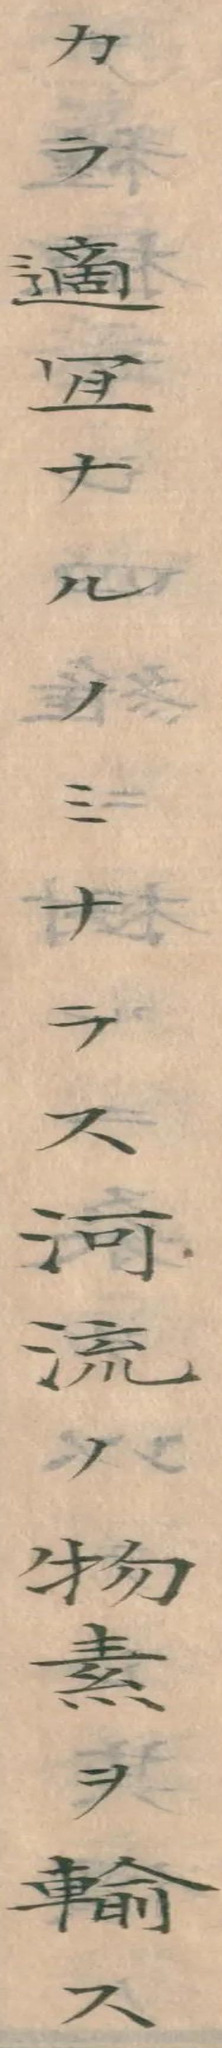カラ適宜ナルノミナラス河流ノ物素ヲ輸ス
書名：蚕桑集成
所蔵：国立国会図書館 National Diet Library, JAPAN
